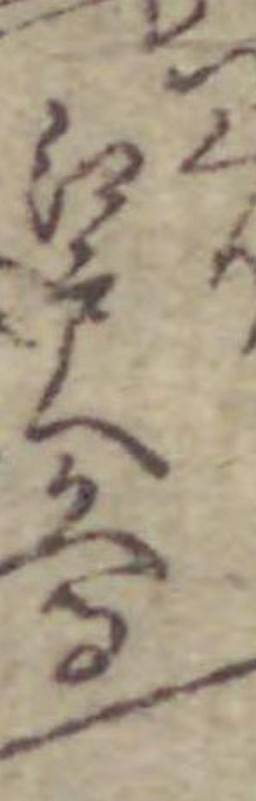江戸へかへる
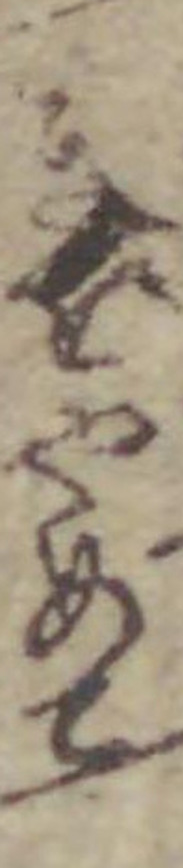きをやめて
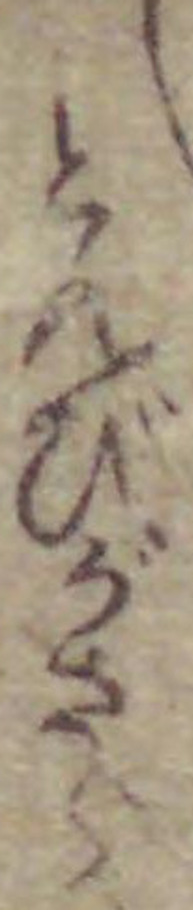とんびがさら
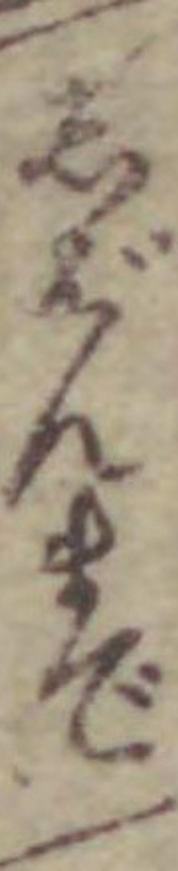しばんまで
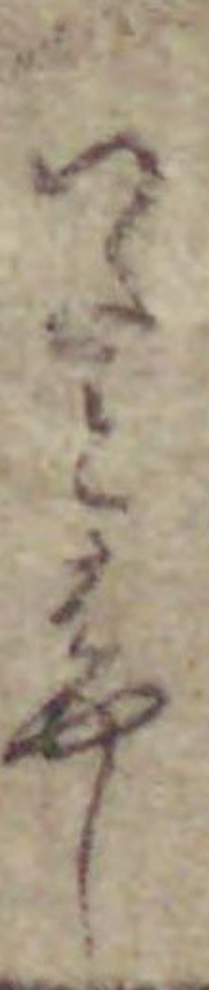つたとはやし
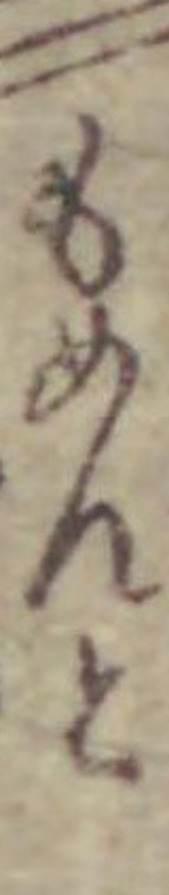もめんと
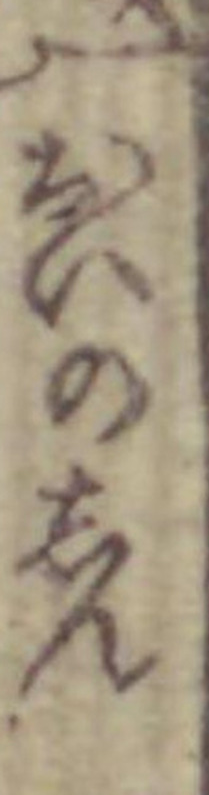おいのしん
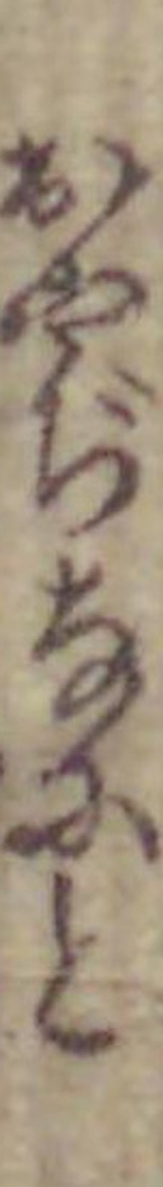おやぢなにと
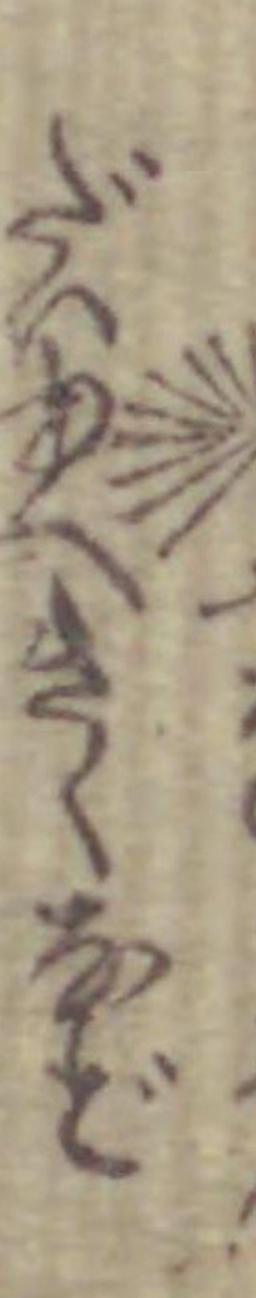だいゆへきくなど
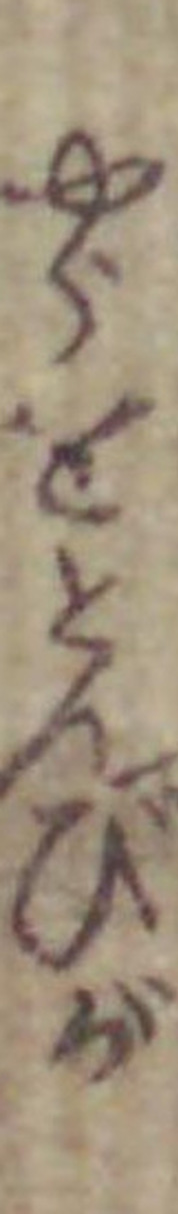やらをとんびが
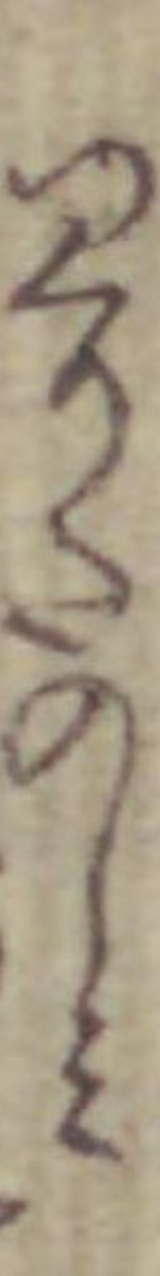つくりたのしみ
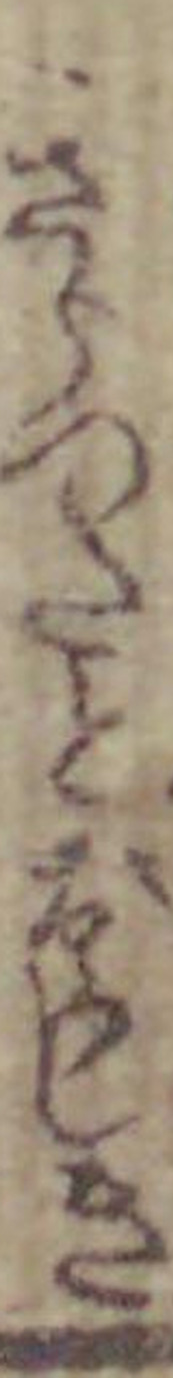さらつたとおかしき
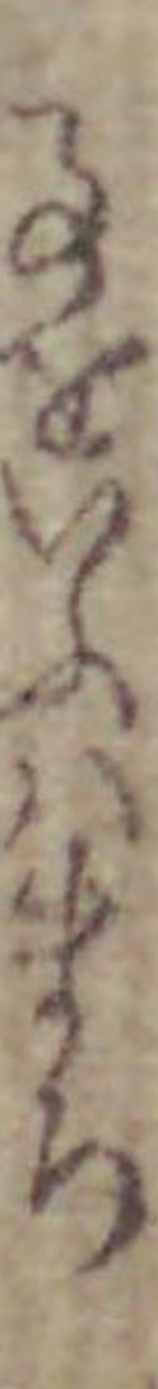事をいふはまち
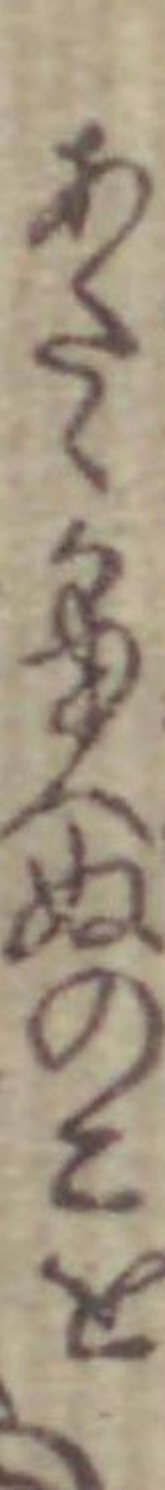あたゝかゆへぬのこを
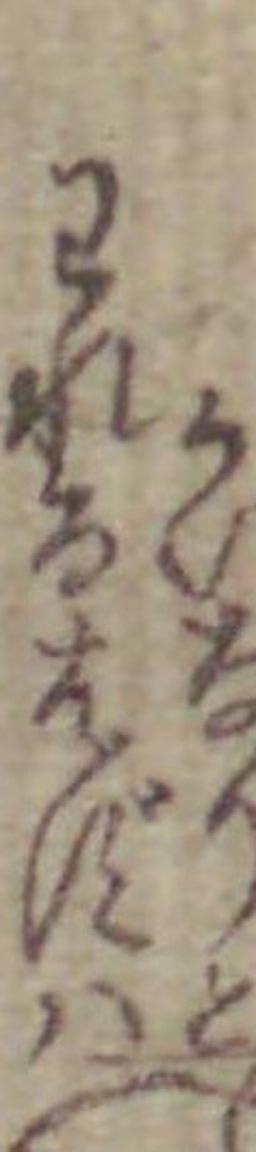われるはずは
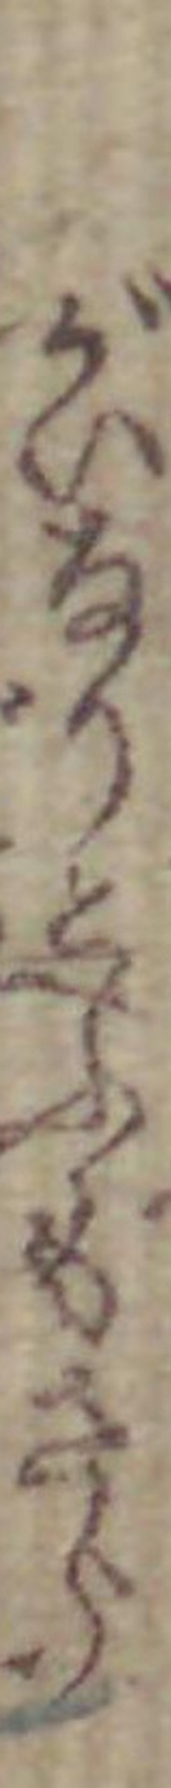がいなりとふもさら
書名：親父布子鳶握 3巻
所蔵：国立国会図書館 National Diet Library, JAPAN
